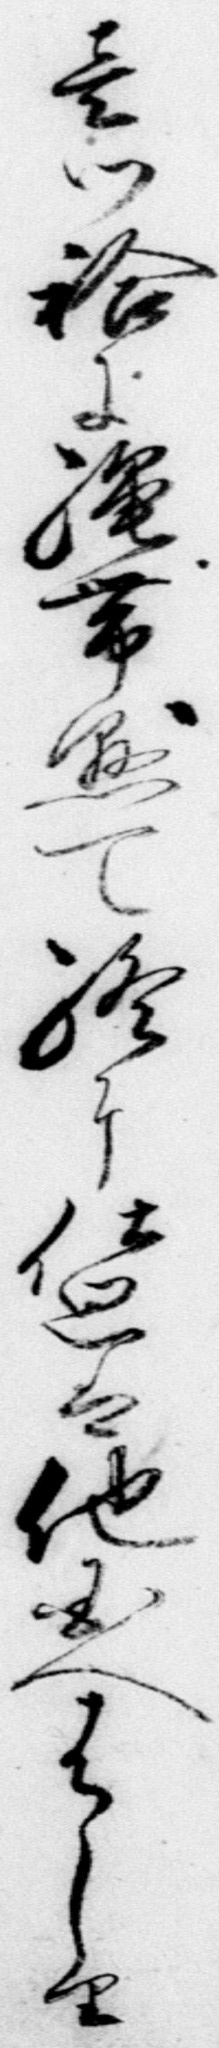壱ツ袷に縄帯懸て終に仕廻は他国へはしり
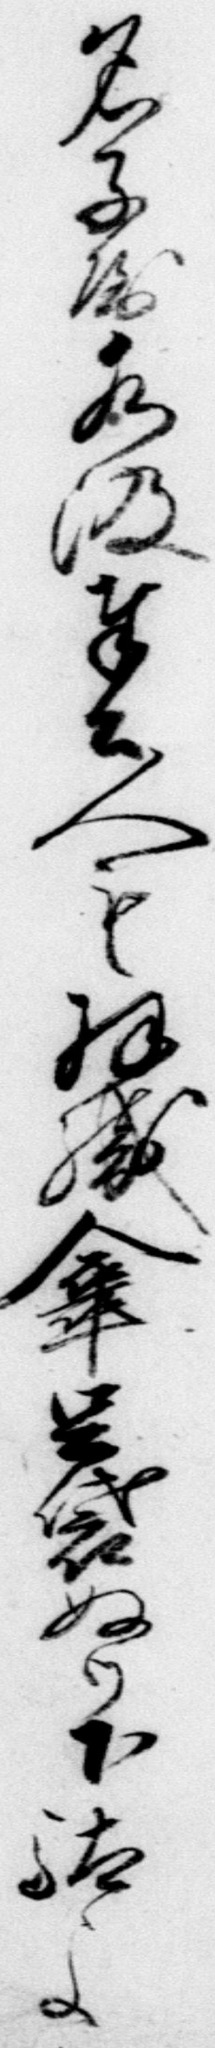名子屋水汲奉公人も羽織傘足袋ぬり下駄よ

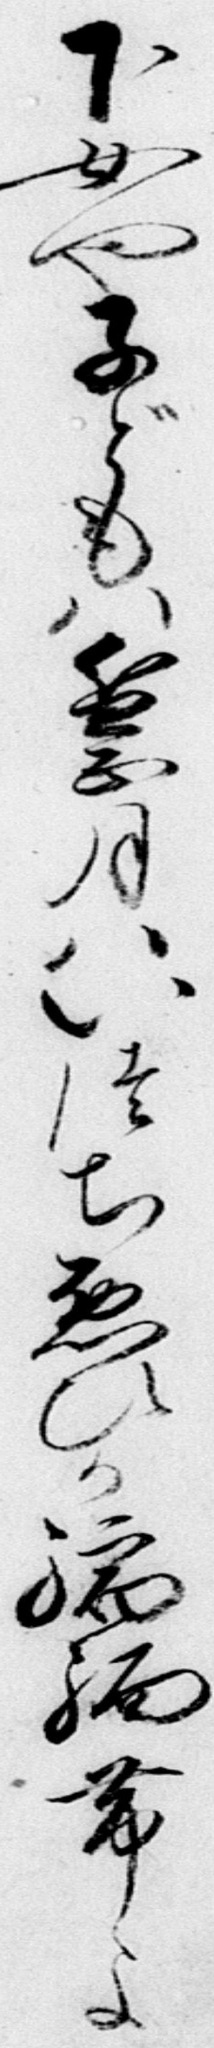下女や子どもは盆正月はいつち悪ひか縮緬帯よ
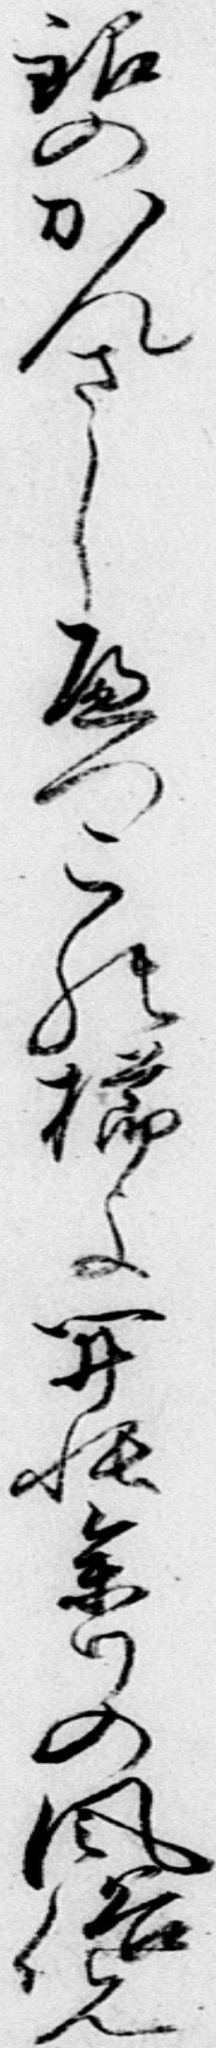銀のかんさしへつこの櫛よ開帳参りの風俗見
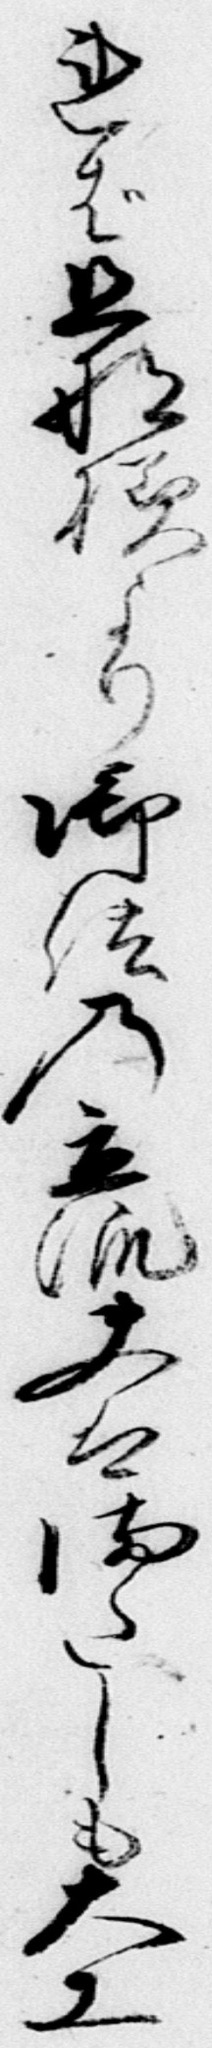れば旦那様より御供の立派夫はまたしも大工
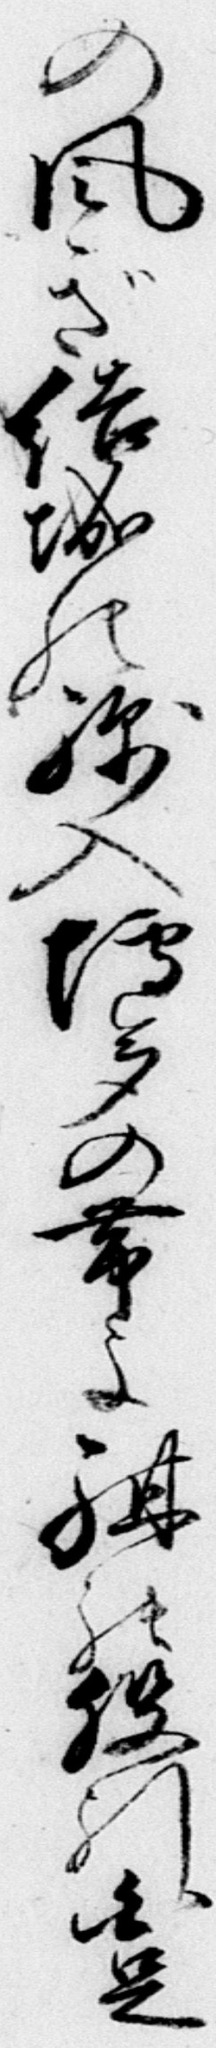の風ぎ結城の綿入博多の帯よ紺の股引白足
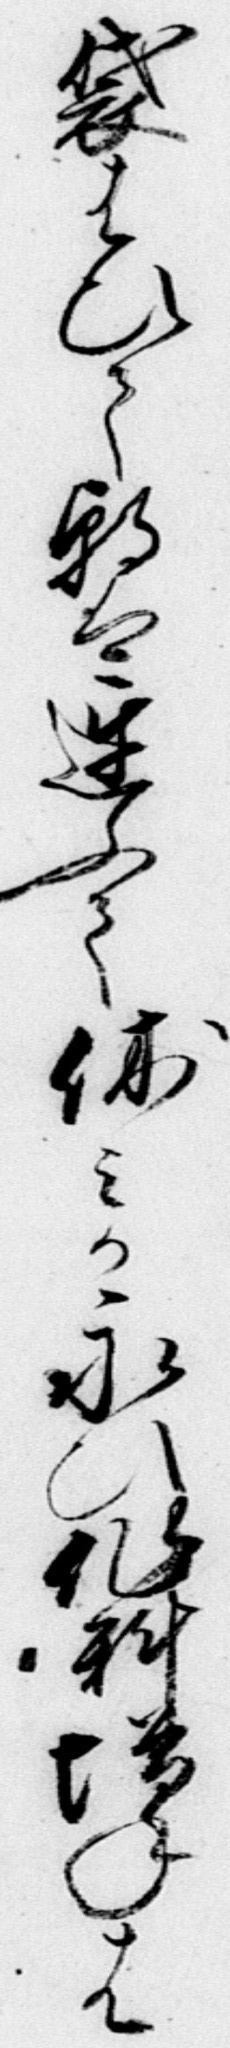袋はひて朝は遅ふて休みか永ひ作料増ねは
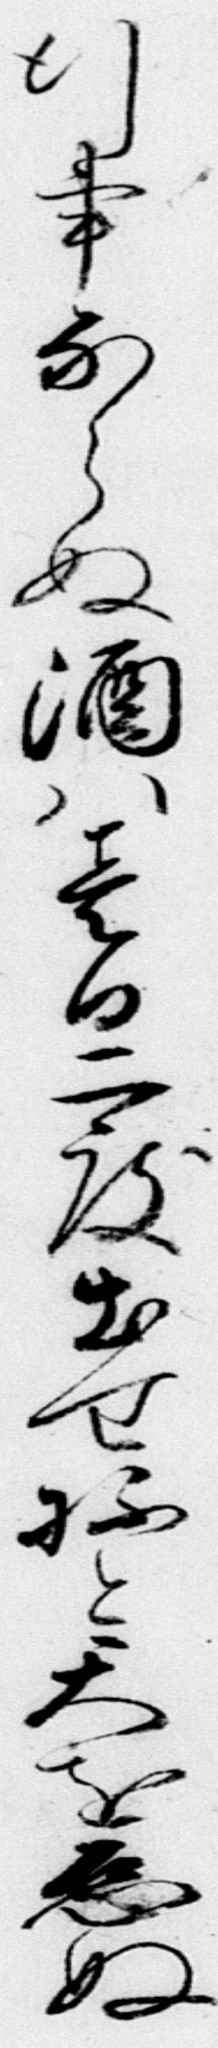行事ならぬ酒は壱日二度出せ抔と天を恐ぬ
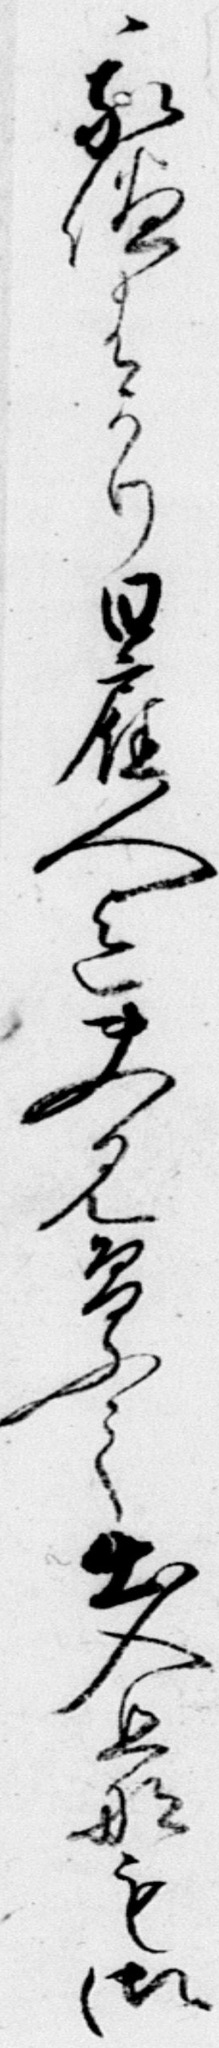我儘はかり日雇人迄夫見習ふて出入旦那も御
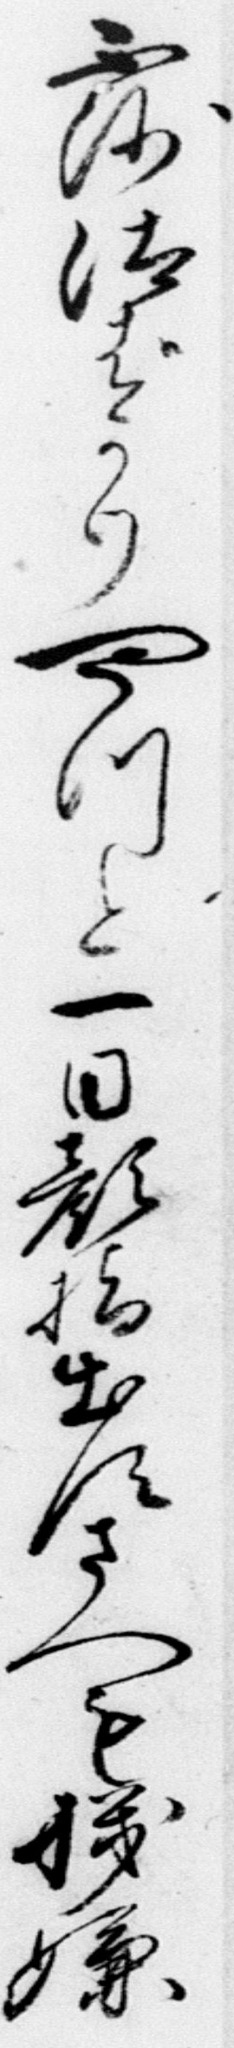不沙汰ばかりやつと一日顔指出すさへも機嫌
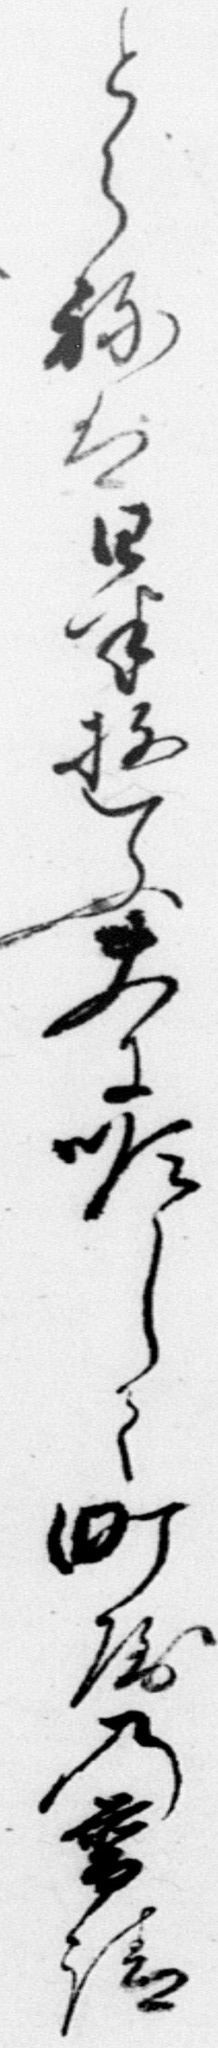とらねは日半遊ふ夫に順して町屋の普請
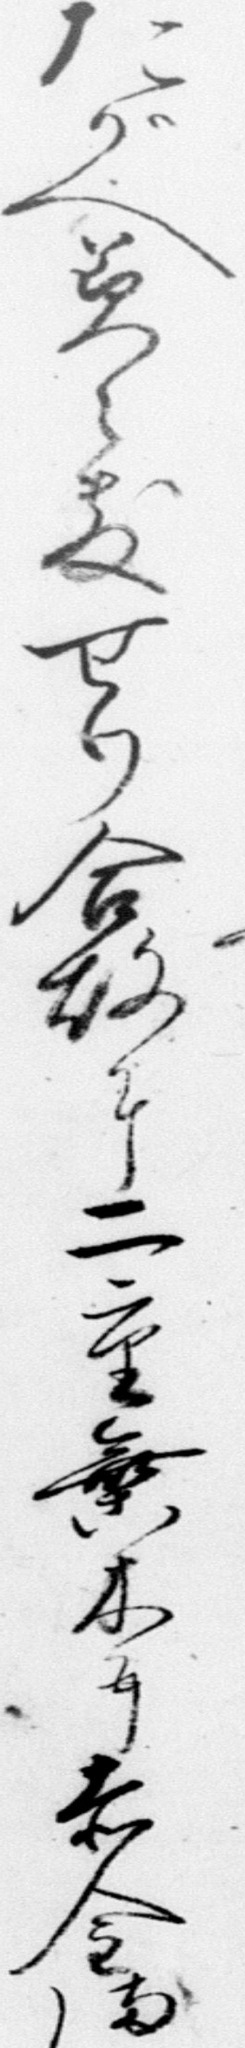たがへ美々敷せり合故に二重垂木に赤金ま
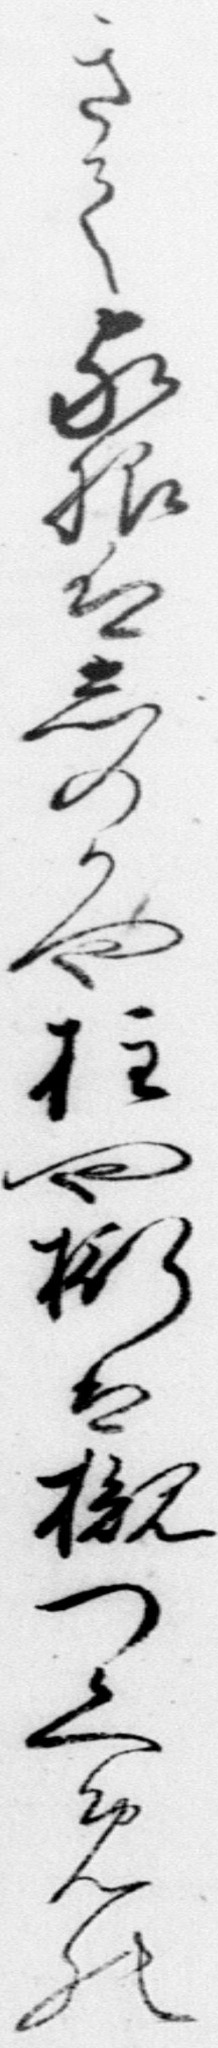きて家根はしのかや柱や桁は櫬つくめの
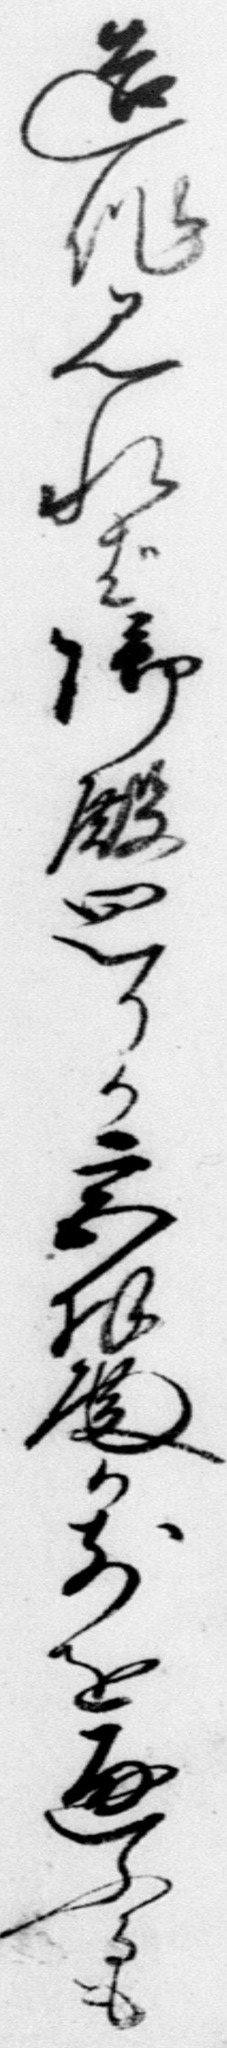造作見れば御殿廻りか宮拝殿か前を通ふるも
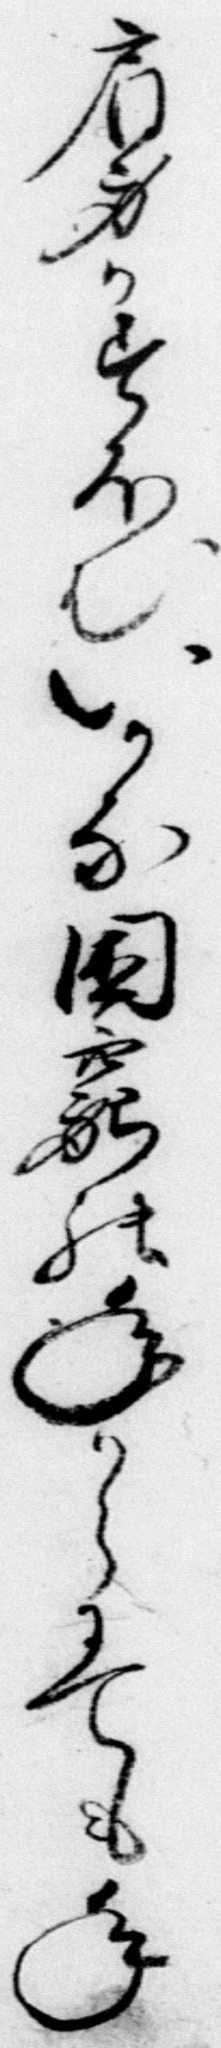肩身かすほむいかな困窮の年からにても年
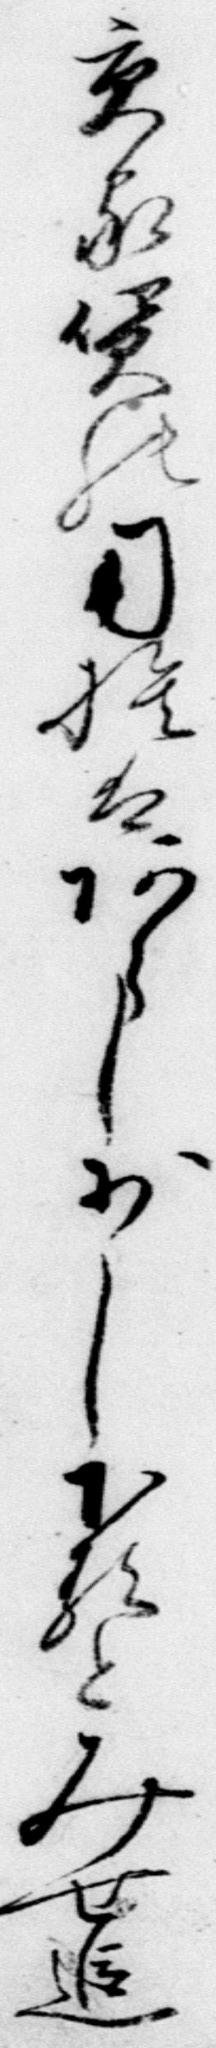貢家賃の用捨はあらし少し下るとみせ追
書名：越後地震由来
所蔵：徳島県立図書館
